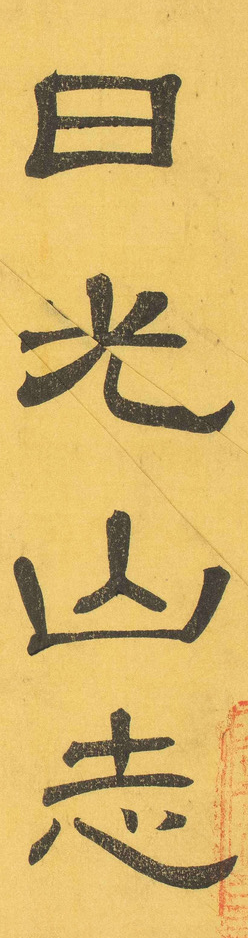日光山志
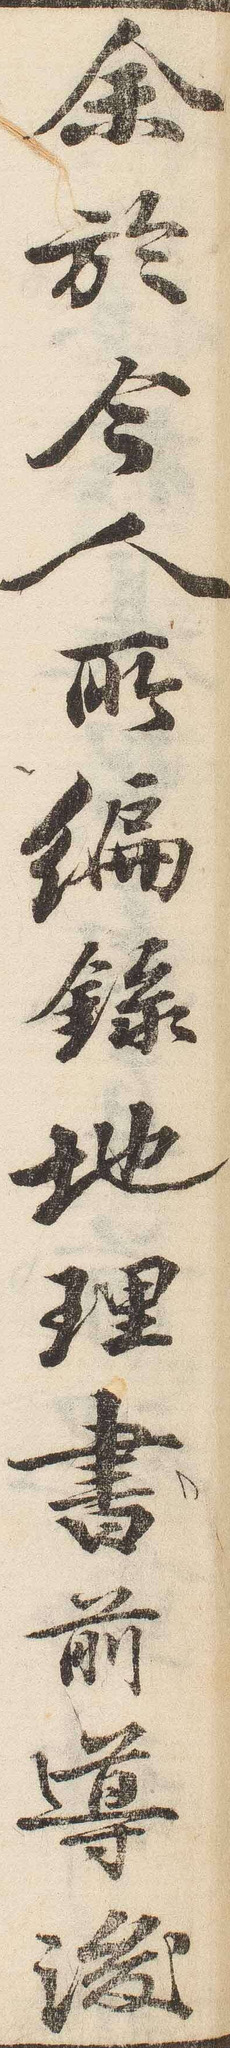余於今人所編録地理書。前導後
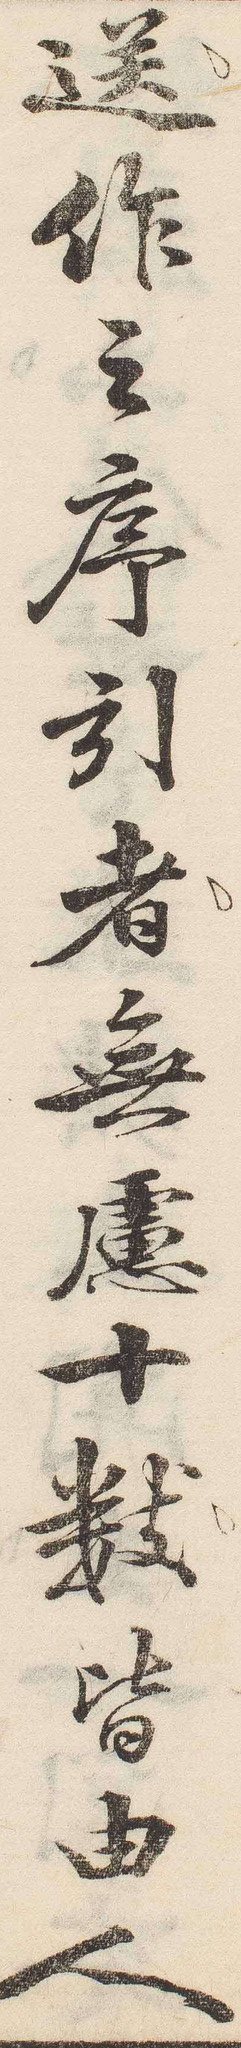送。作之序引者。無慮十数。皆由人
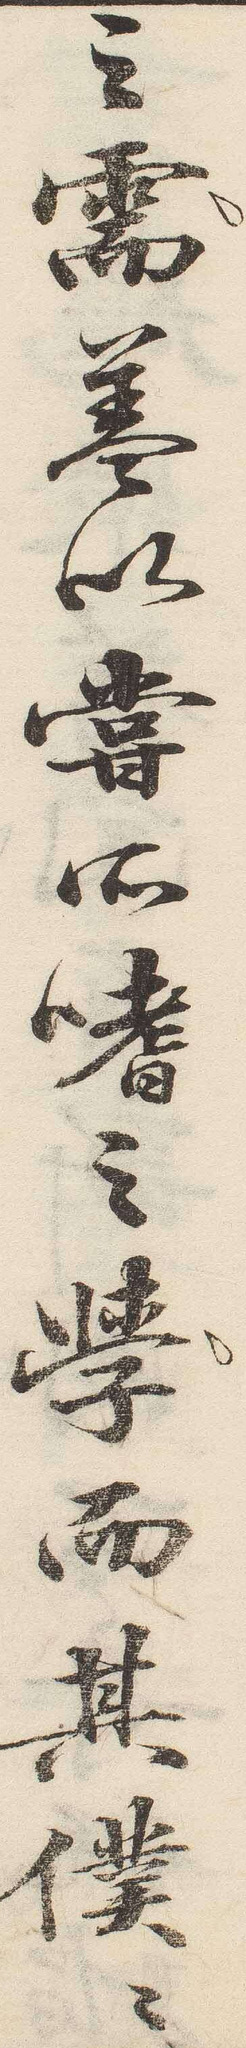之需。蓋以嘗所嗜之学。而其僕々
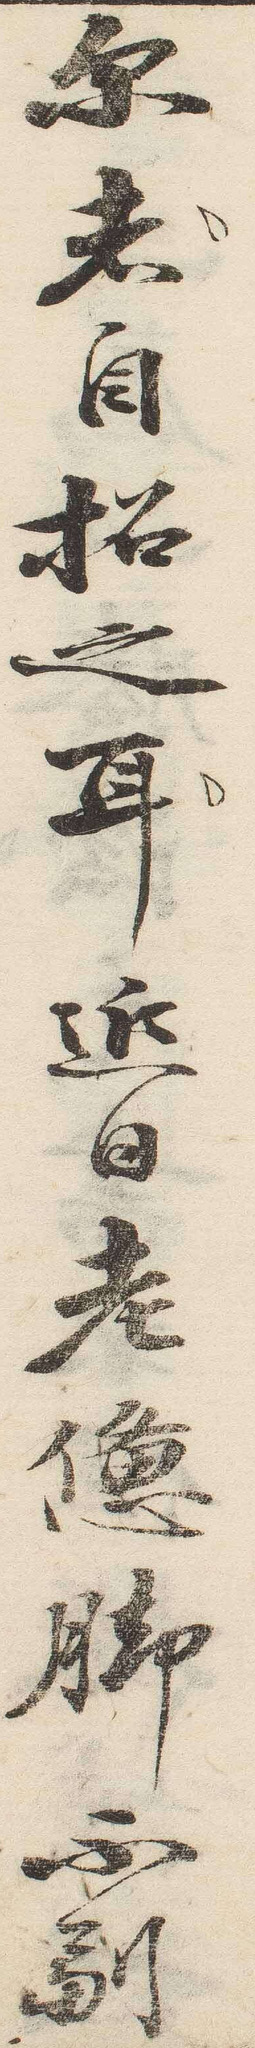尓者。自招之耳。近日老憊脚不副
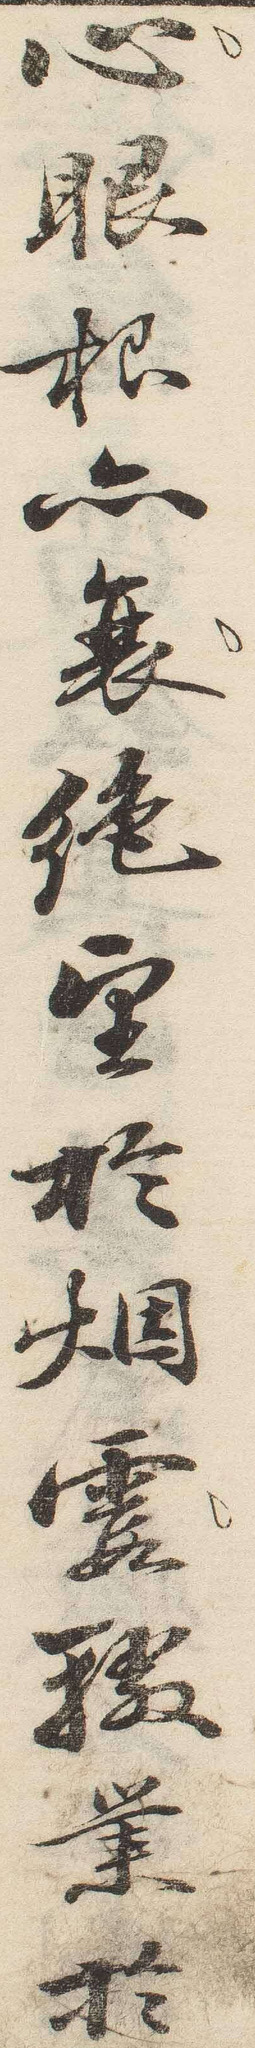心。眼根亦襄。絶望於烟霞。輟業於
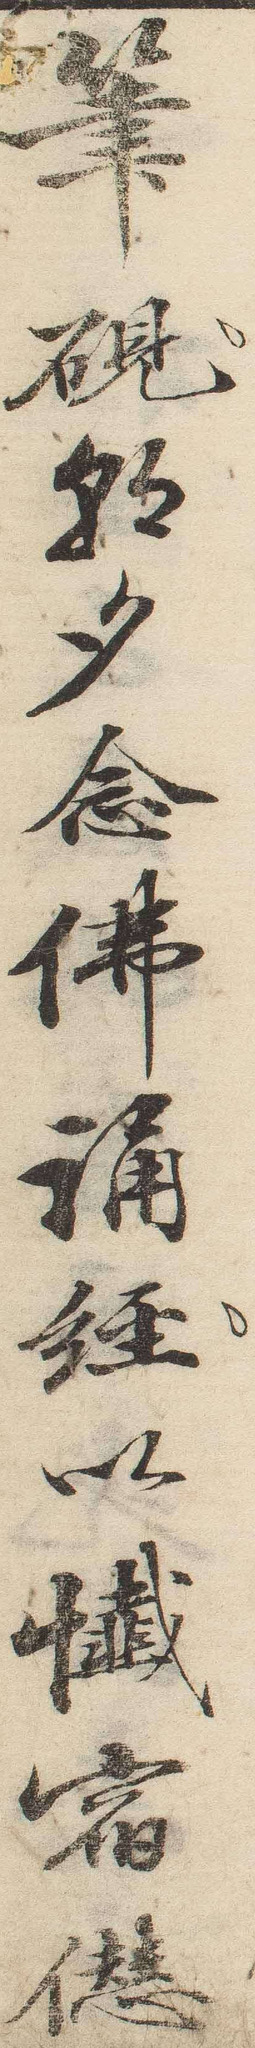筆硯。朝夕念仏誦経。以懴宿𠎝

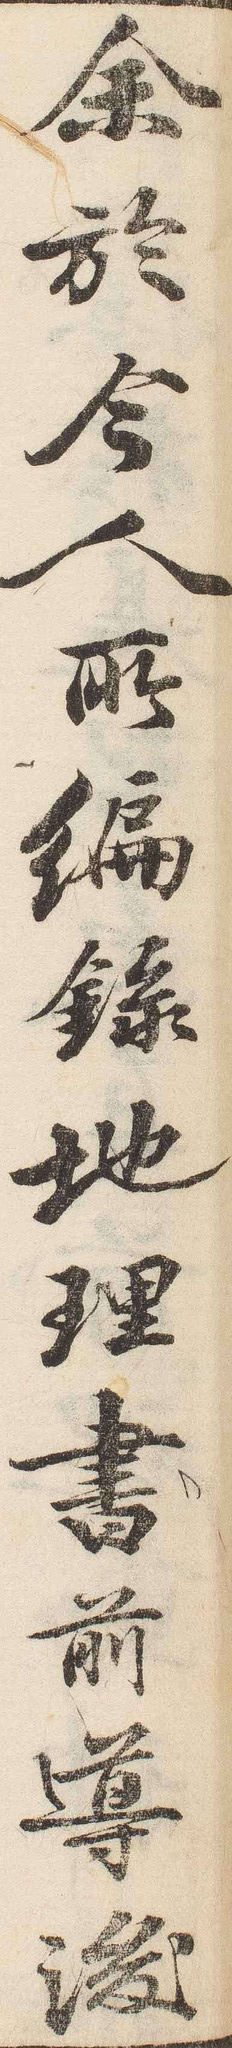余於今人所編録地理書。前導後
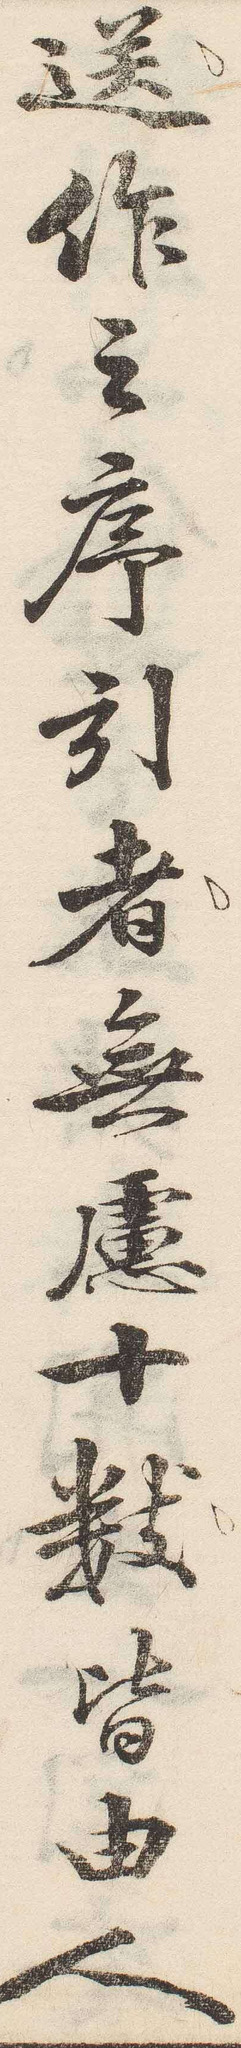送。作之序引者。無慮十数。皆由人
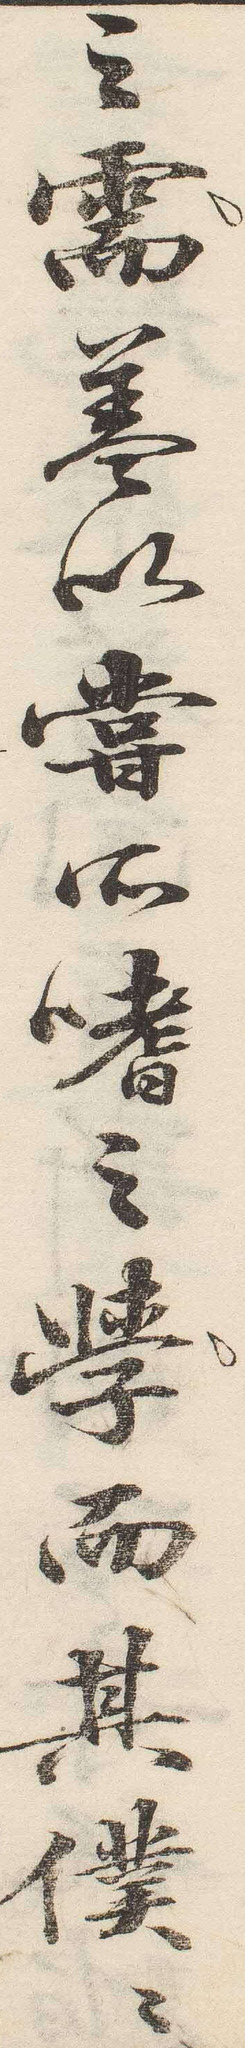之需。蓋以嘗所嗜之学。而其僕々
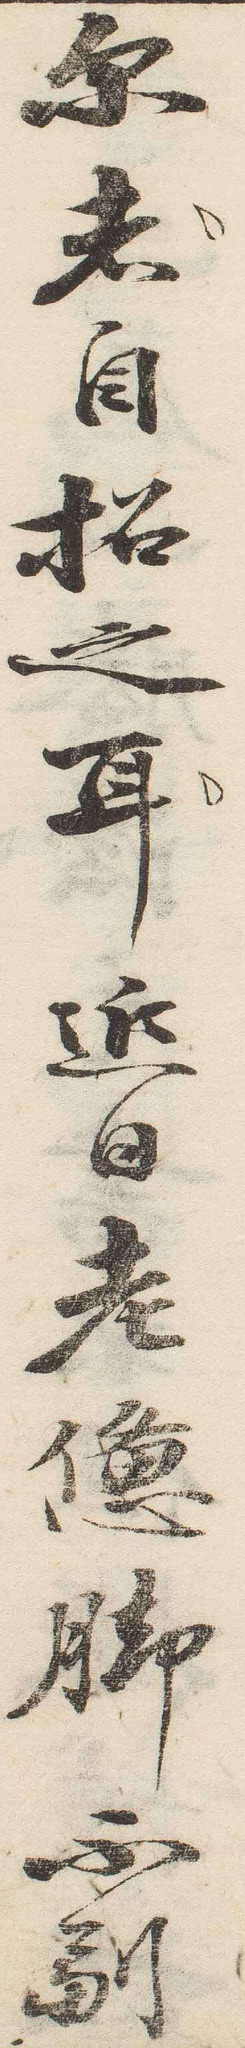尓者。自招之耳。近日老憊脚不副
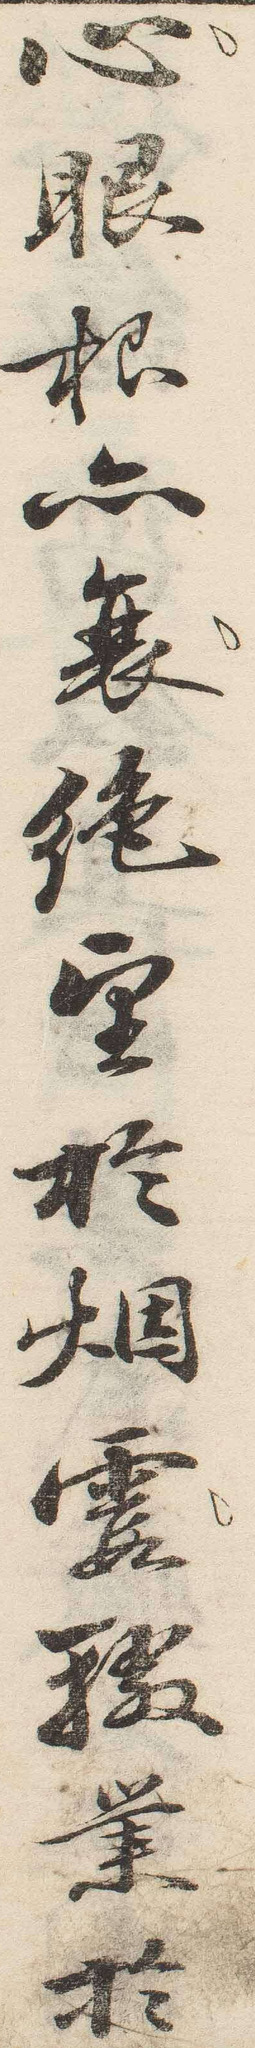心。眼根亦襄。絶望於烟霞。輟業於
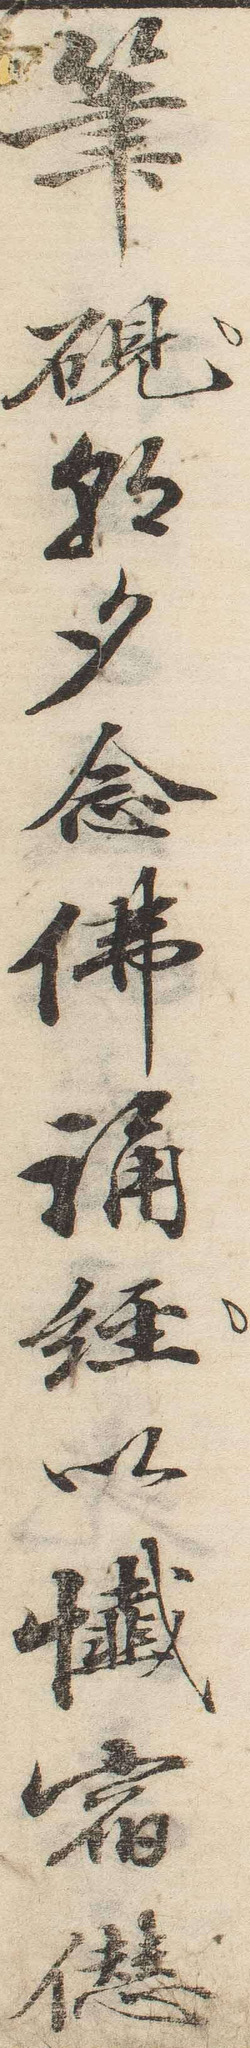筆硯。朝夕念仏誦経。以懴宿𠎝

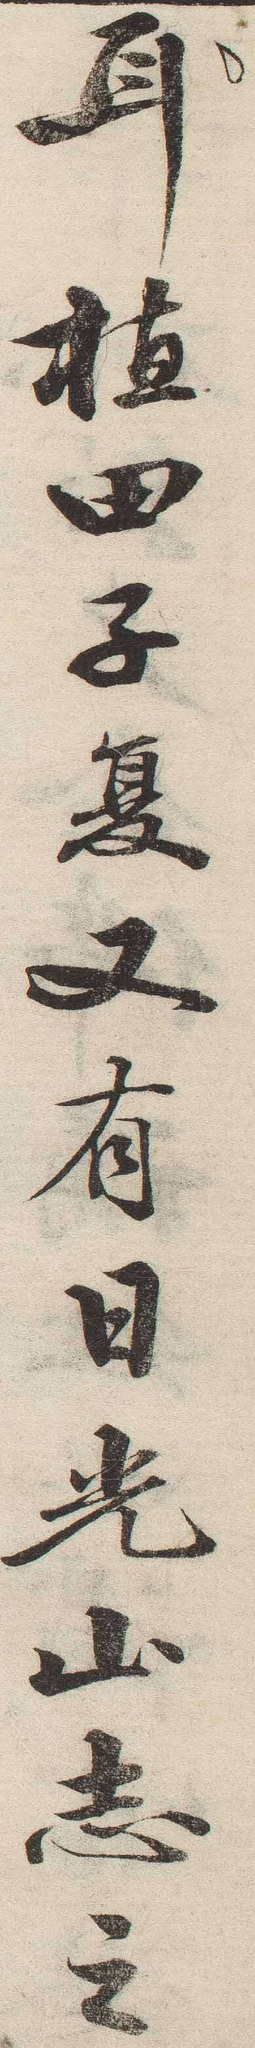耳。植田子夏又有日光山志之
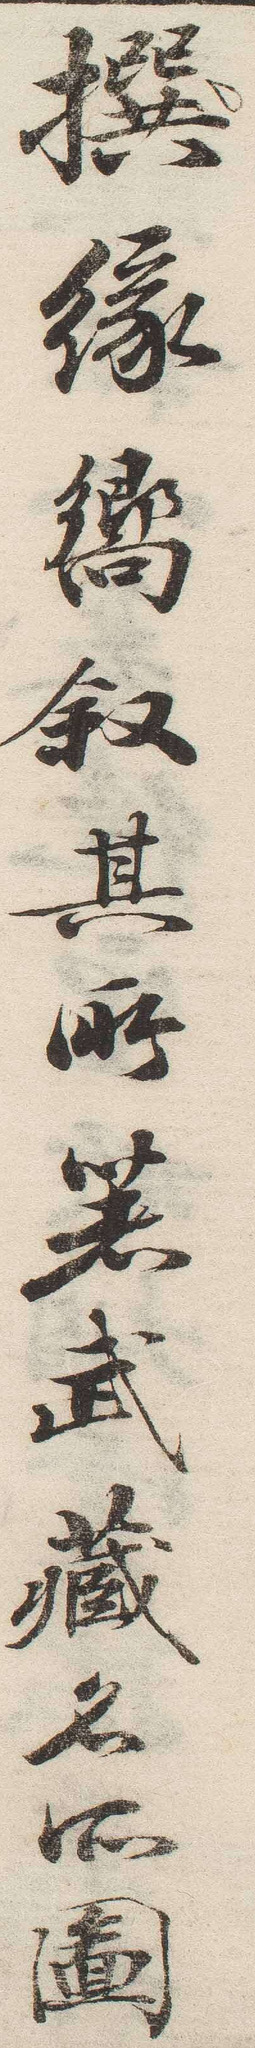撰。縁嚮叙其所著武蔵名所図
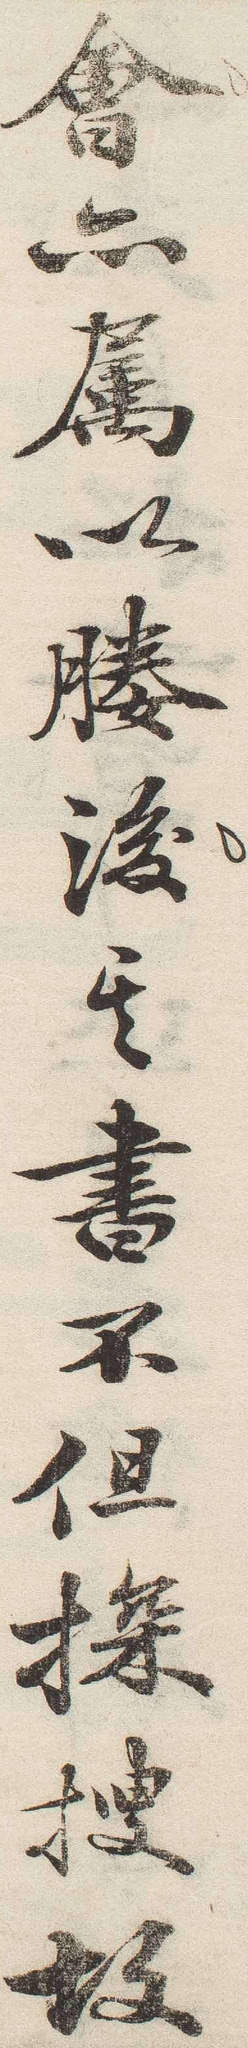会亦属以媵後。其書不但探捜故
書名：日光山志
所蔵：東京学芸大学附属図書館 国文学研究資料館
